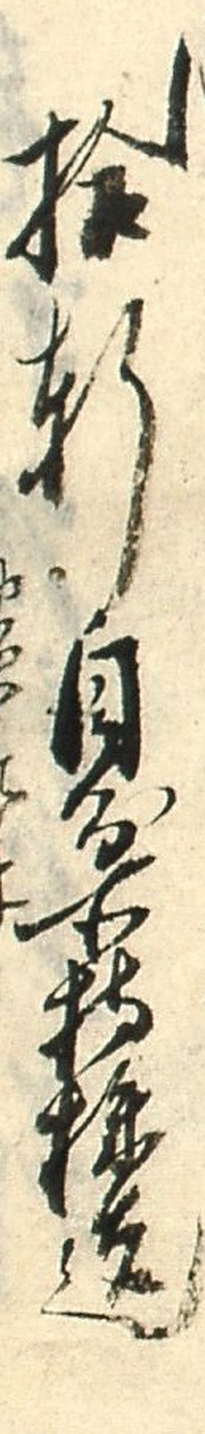拾軒自分所持株造
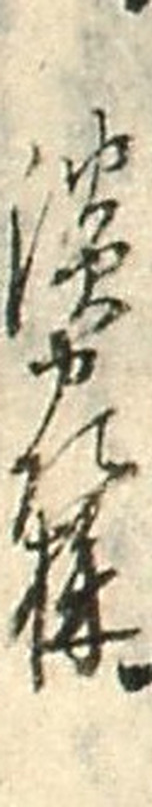淡州株
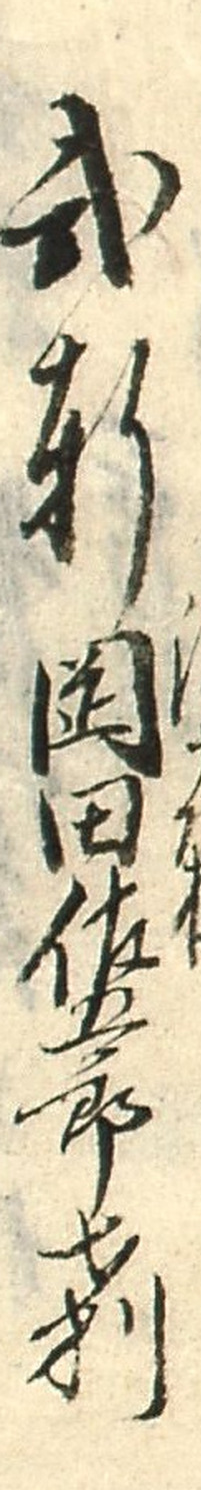弐軒岡田佐五郎才判
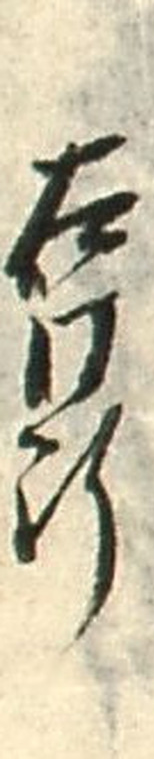右同断
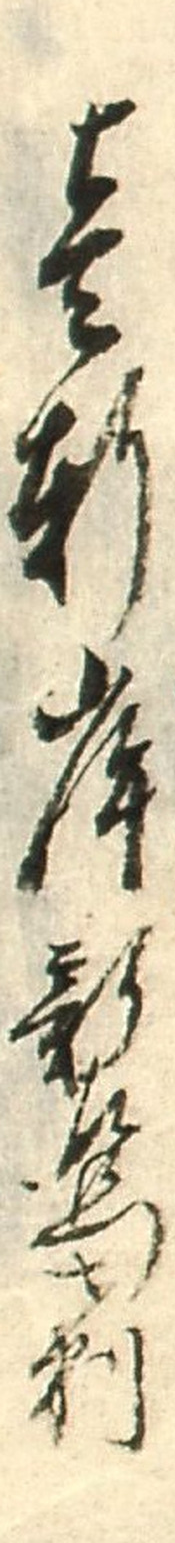壱軒岸新左衛門才判
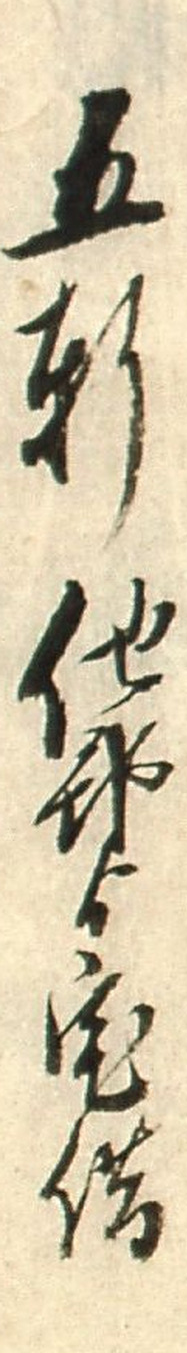五軒他郡ゟ宅借
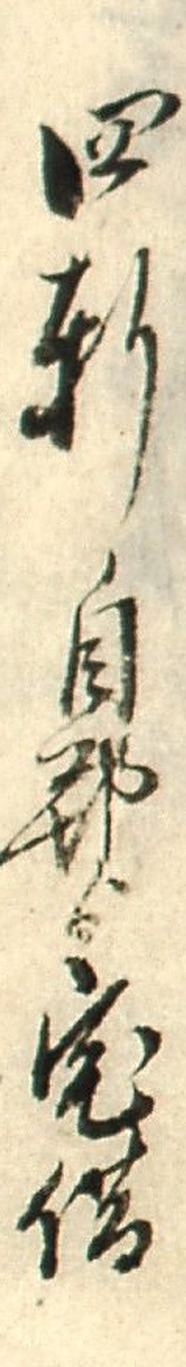四軒自郡ゟ宅借
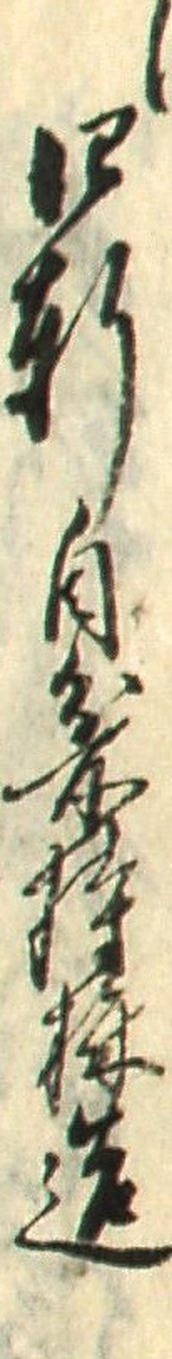七軒自分所持株造
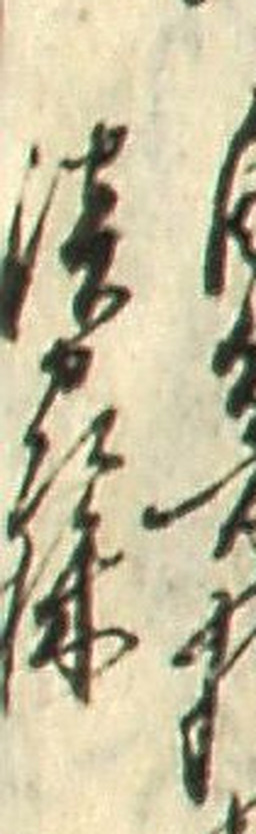淡州株
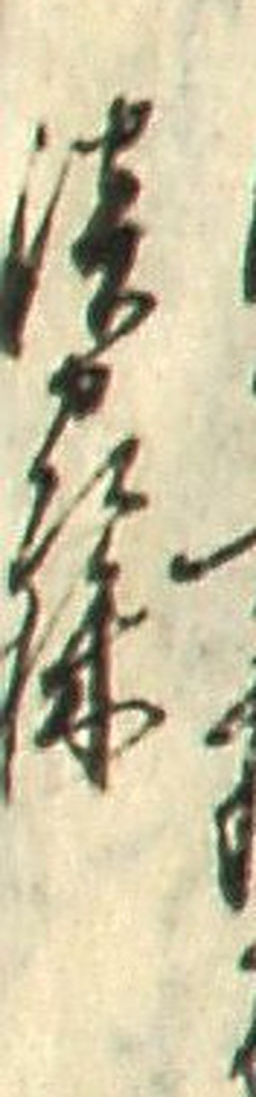淡州株

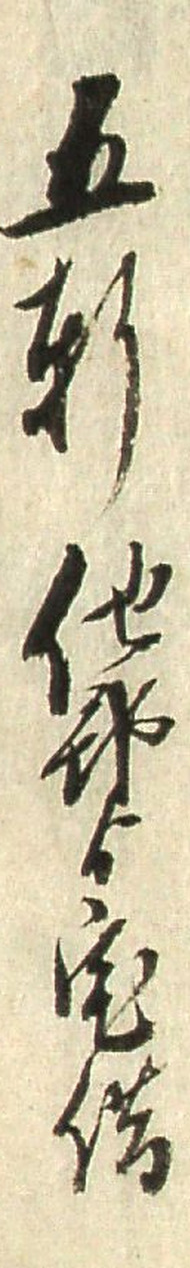三軒他郡ゟ宅借
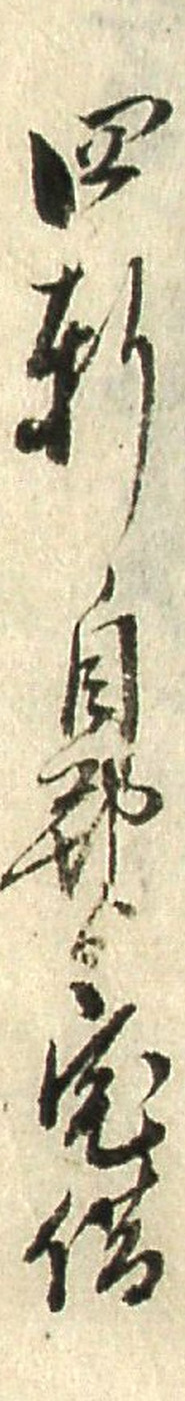三軒他郡ゟ宅借
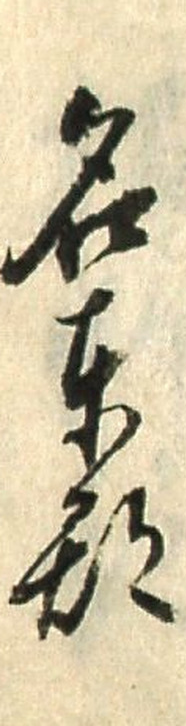名東郡
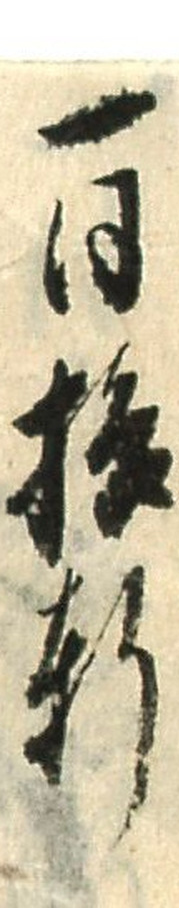一同拾軒
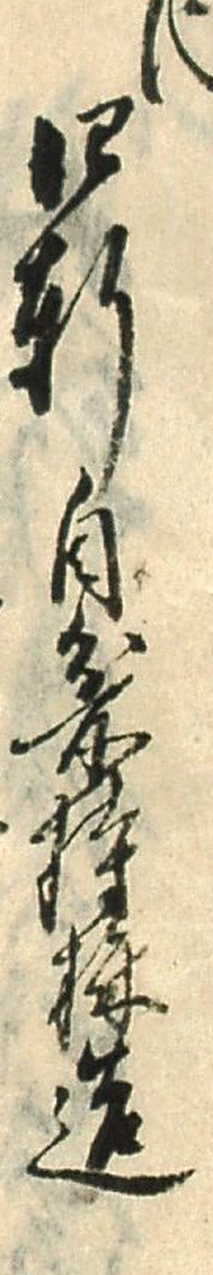四軒自分所持株造
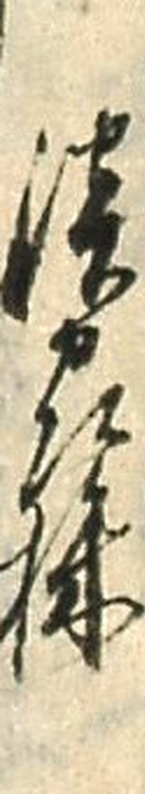淡州株
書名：南北拾郡造酒屋数並株数調子帳
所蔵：鳴門教育大学 Naruto University of Education
